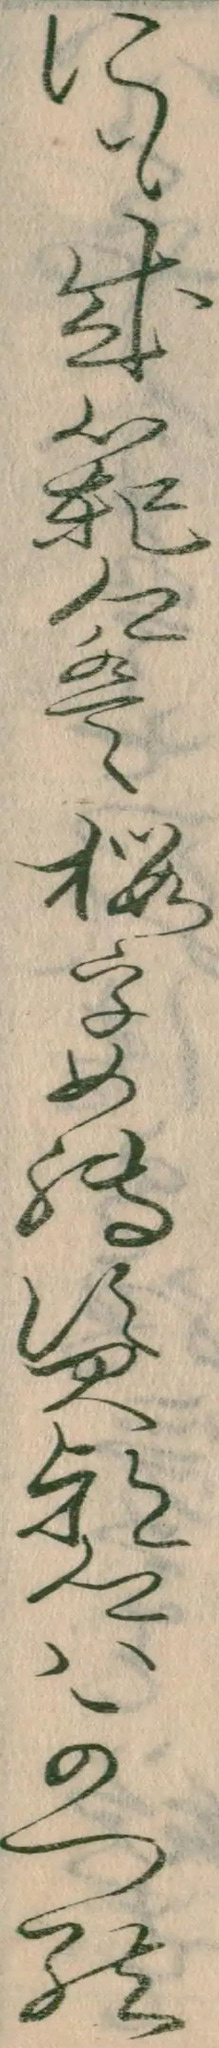にも成範卿は桜をめて資朝卿はかつの
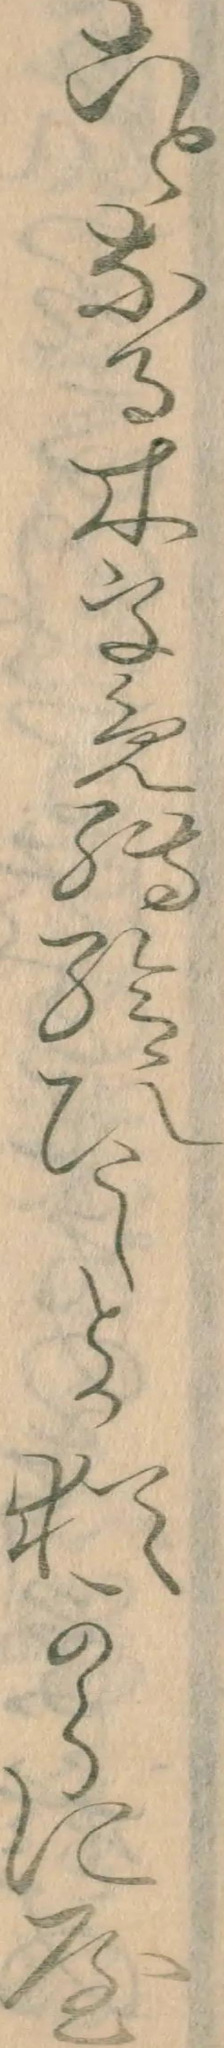ことなる木をめて給ひしとか猶からにや
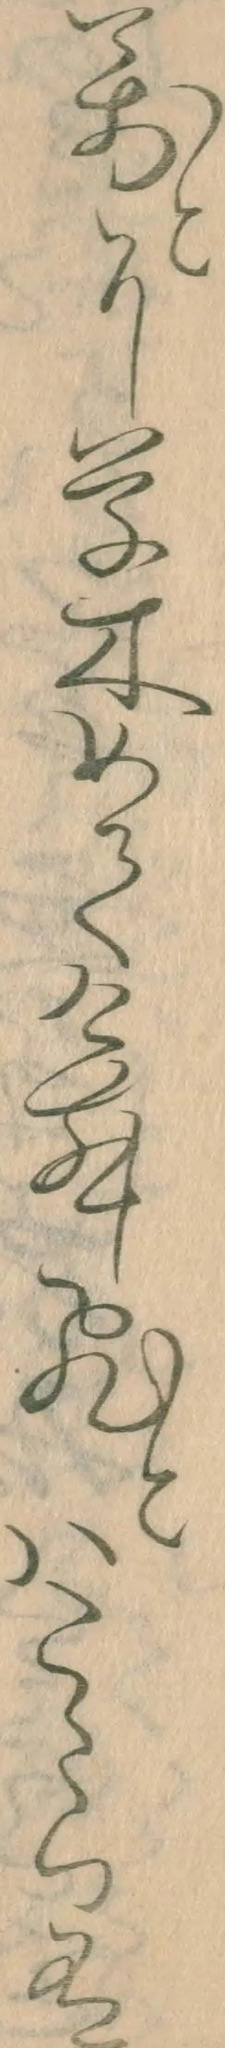まとに草木めてけむひとはこゝら有
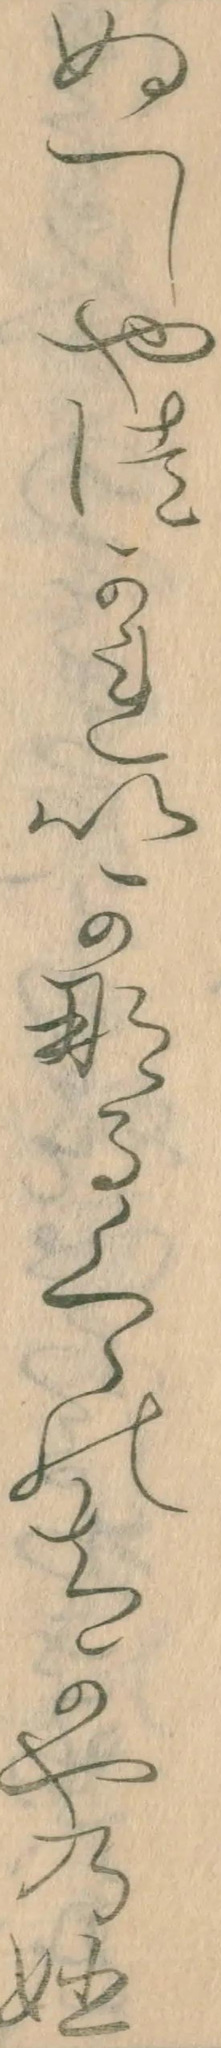ぬへしやつかれいかなる上のちかやの妙
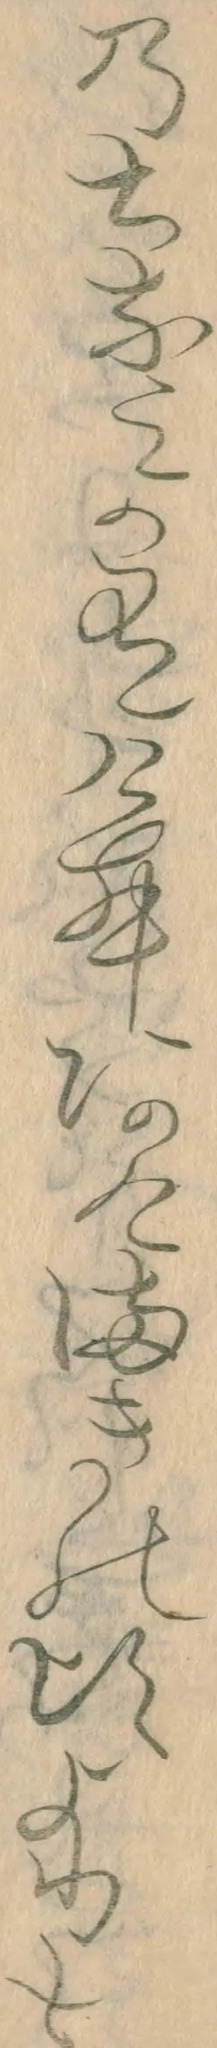の土なみの有けむあけまきの頃よりも
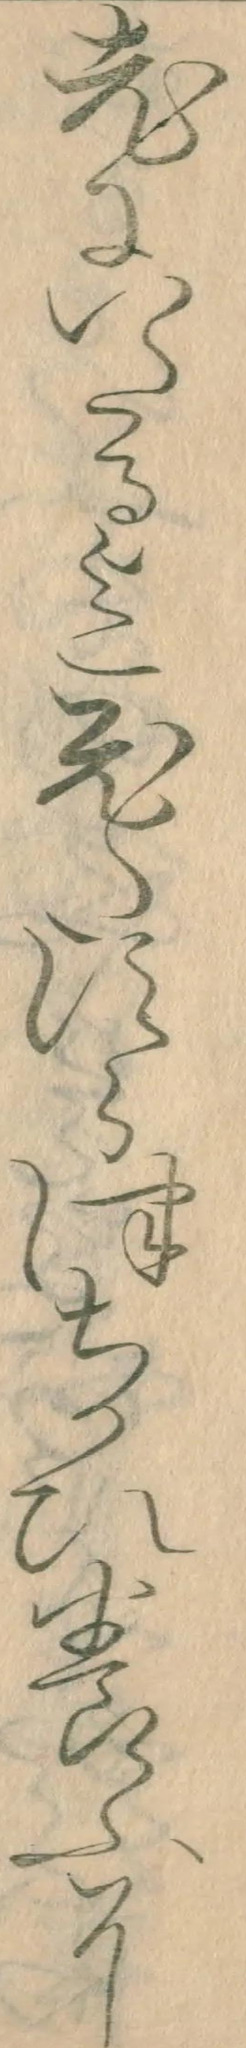老にいたる迄ひたすらつちかひ養ふに
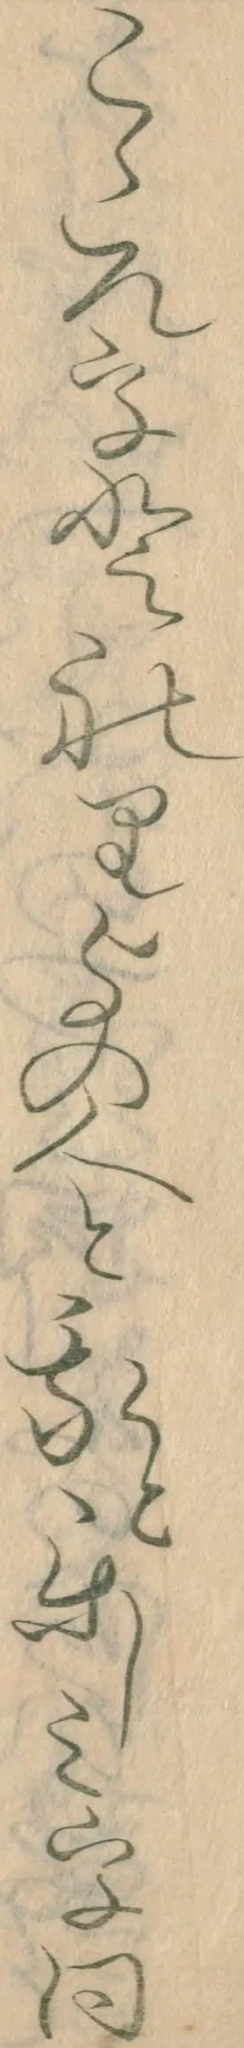こゝろをとれりよの人と我と楽しみを同
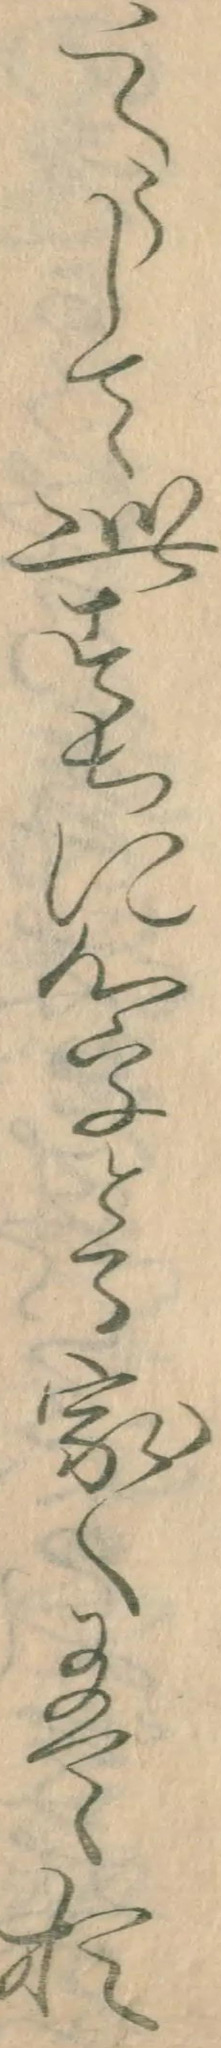しうして此すちに心をとて家〳〵にはお

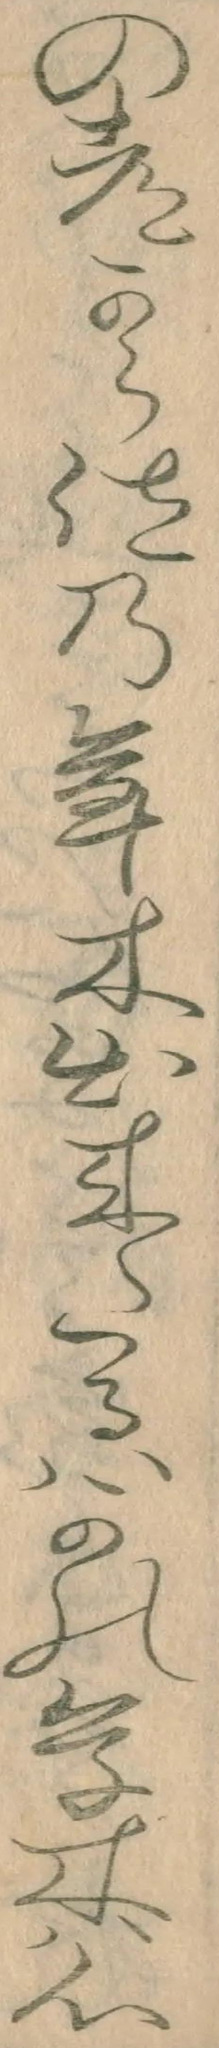のつからさの草木出来たるはかの草木は心
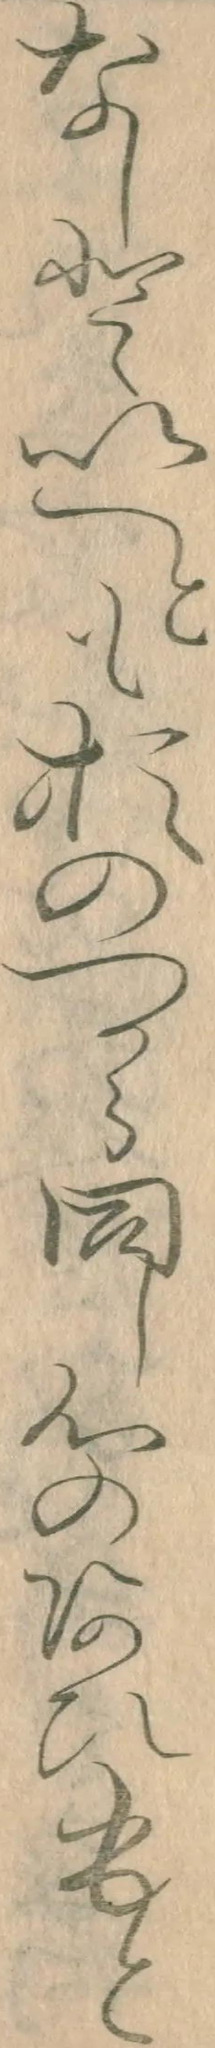なしといへともおのつから同し心のあひもと
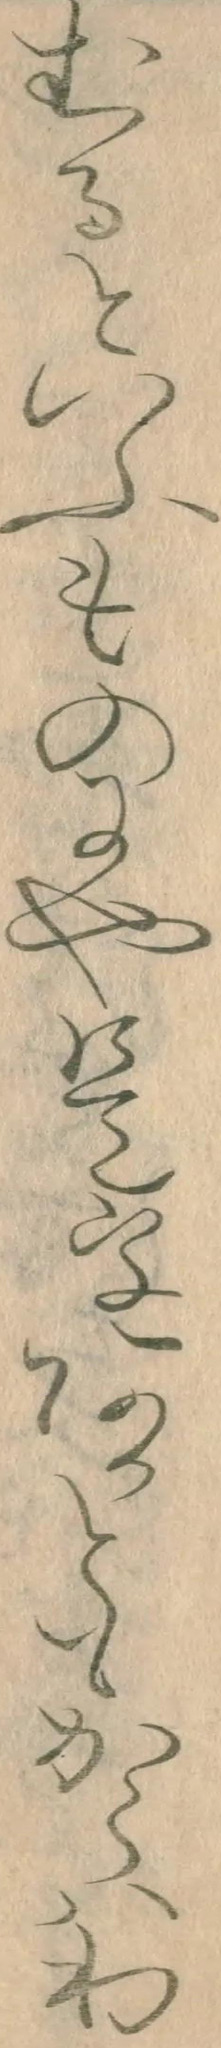むるといふものにや是をあかともからはわ
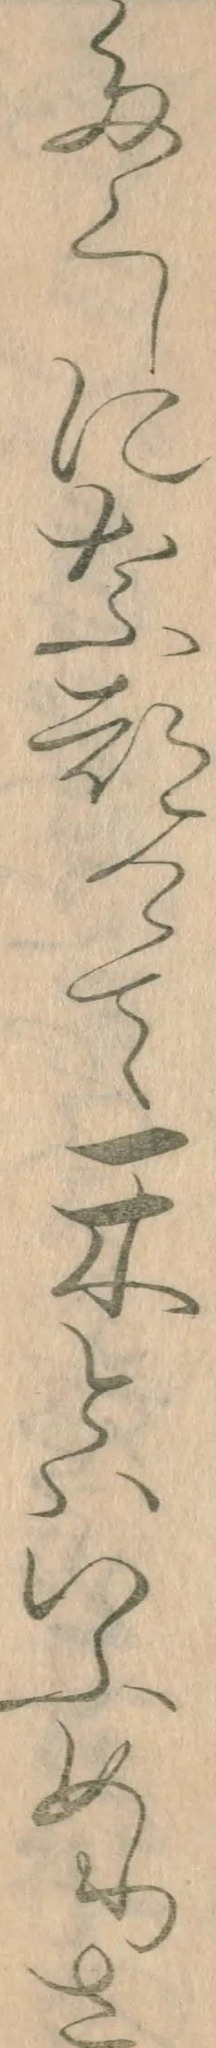たくしになつけて一木とはいふめりさ
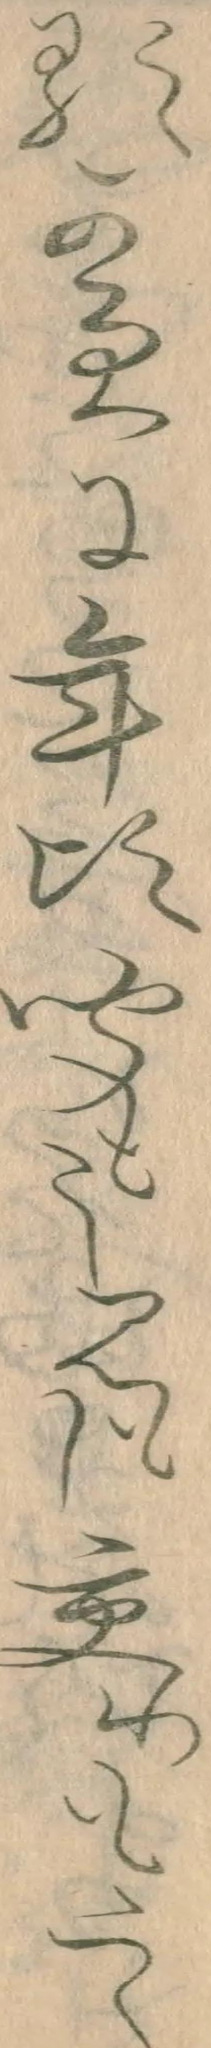るからに年頃聞もし見もし交りもし
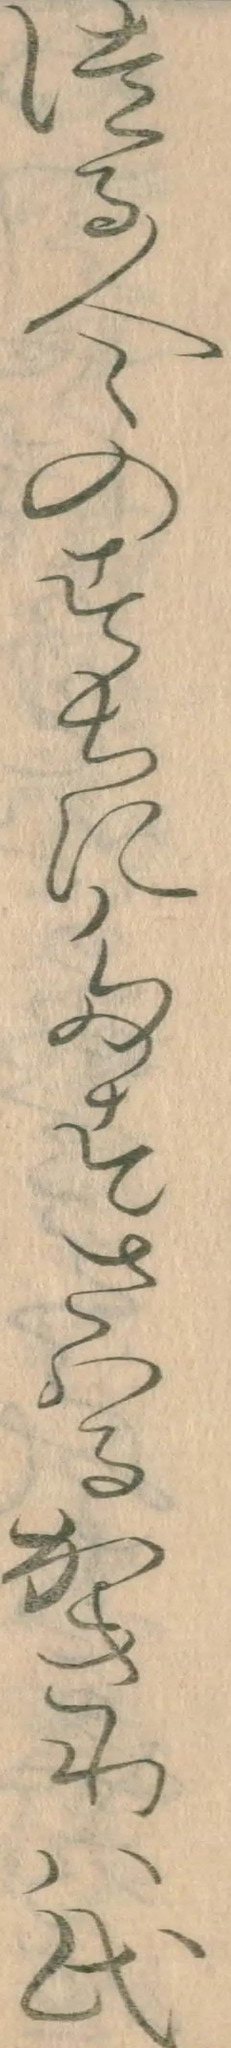つる人々のすちにたすさはるかきりは此
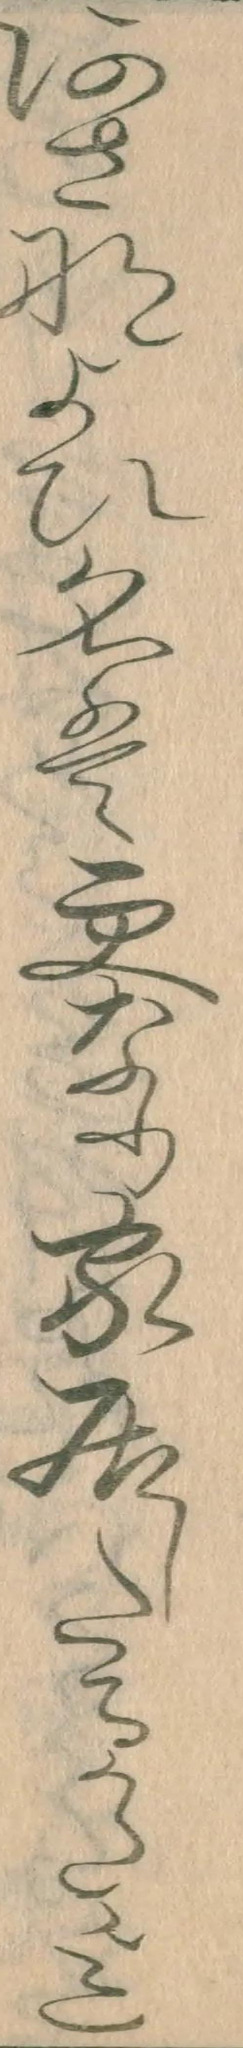あさなよひなは更なり家居したるかた迄
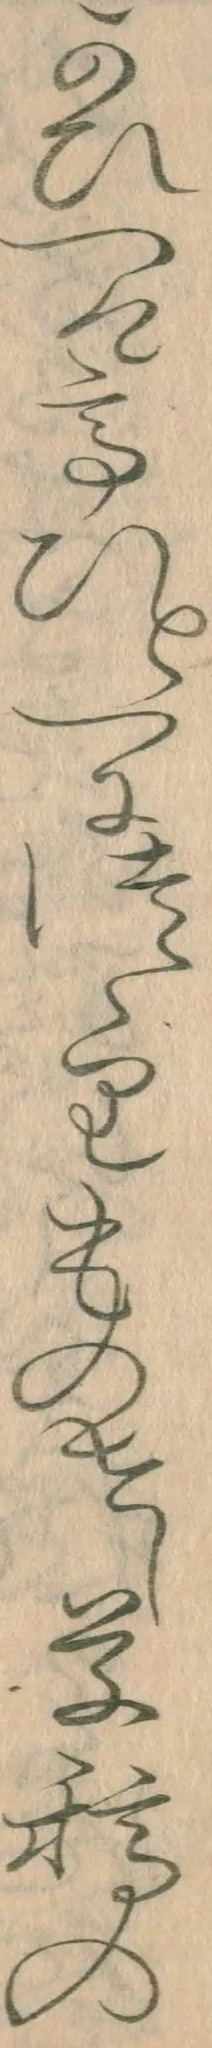かひつけてひとつにつゝりものせし草稿の
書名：草木奇品家雅見 3巻. [3]
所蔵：国立国会図書館 National Diet Library, JAPAN
